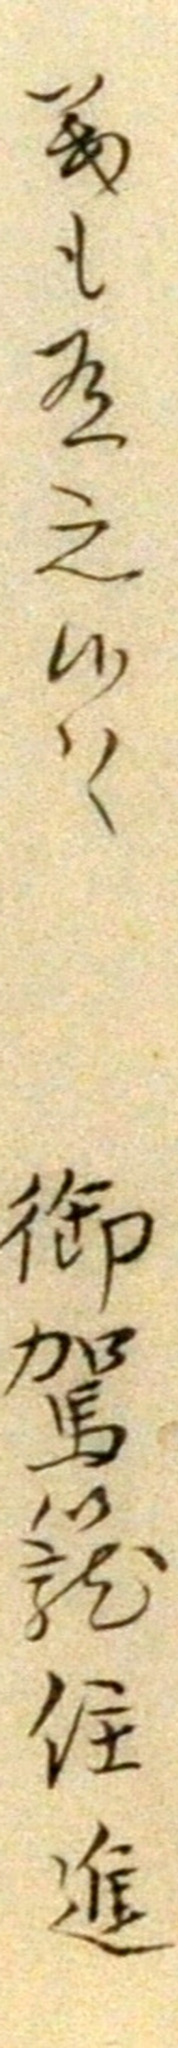義も有之候ハヽ御駕籠注進
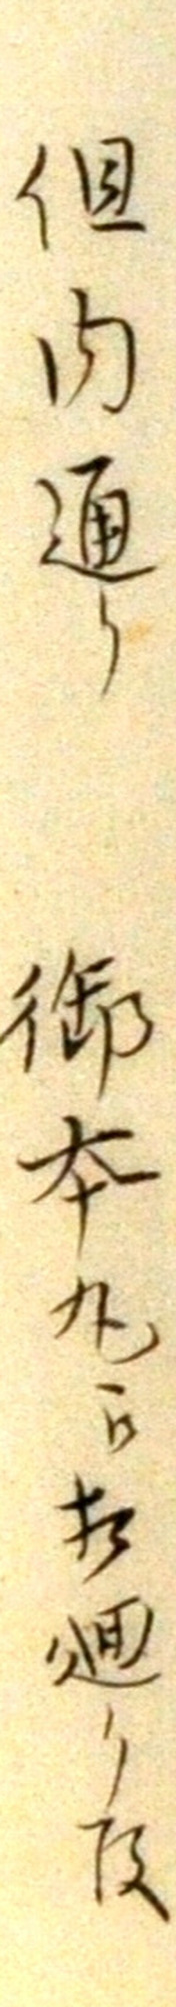但内通り御本丸江相廻り候

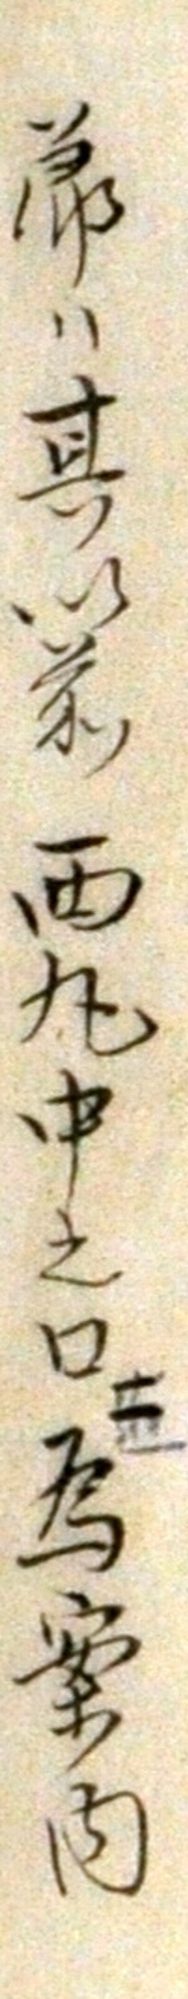節ハ其以前西丸中之口ニ為案内
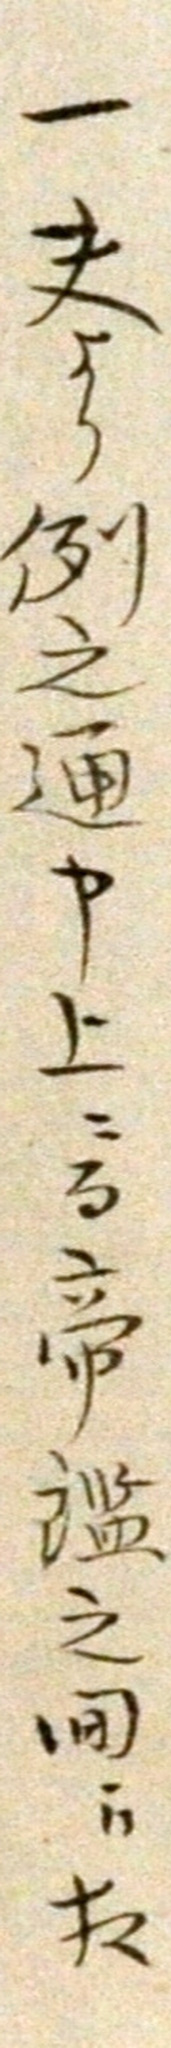一夫より例之通申上ニ而帝鑑之間え相
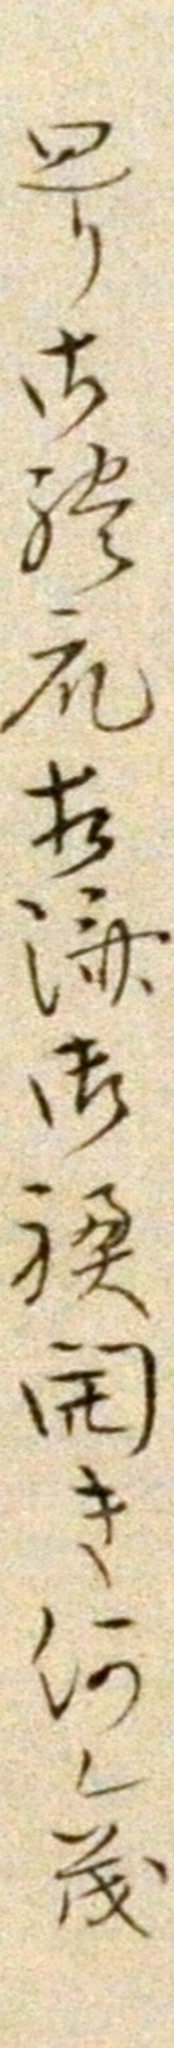廻り御礼衆相済御襖開き何レも
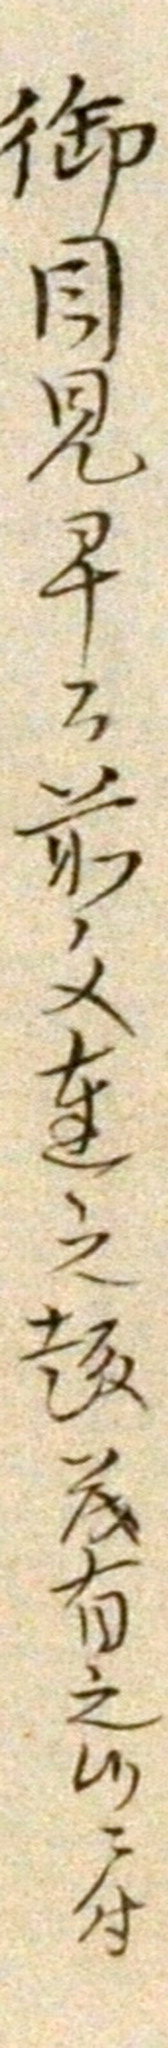御目見畢而前文達之趣も有之候ニ付
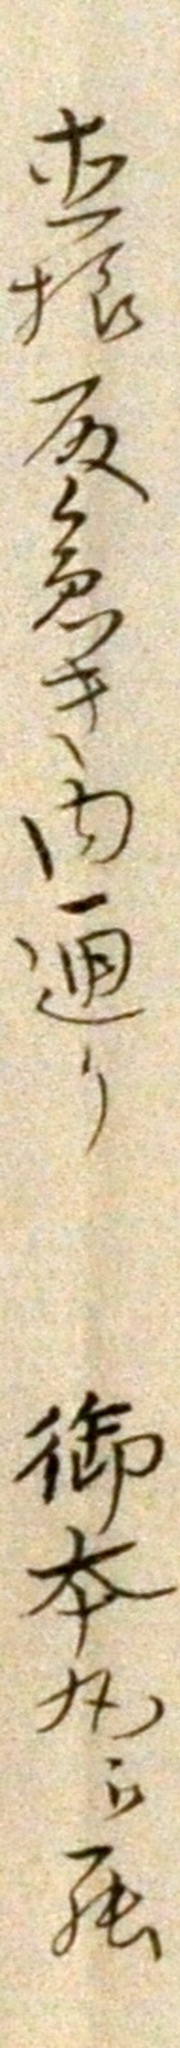直様取急き内通り御本丸え罷
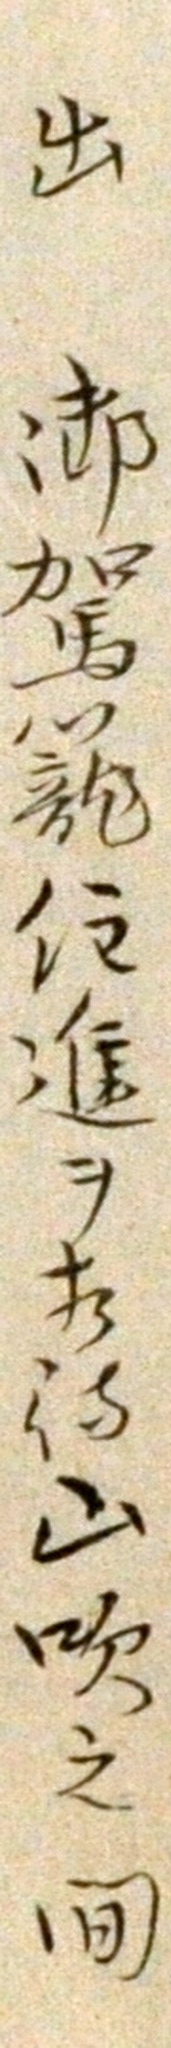出御駕籠注進ヲ相待山吹之間
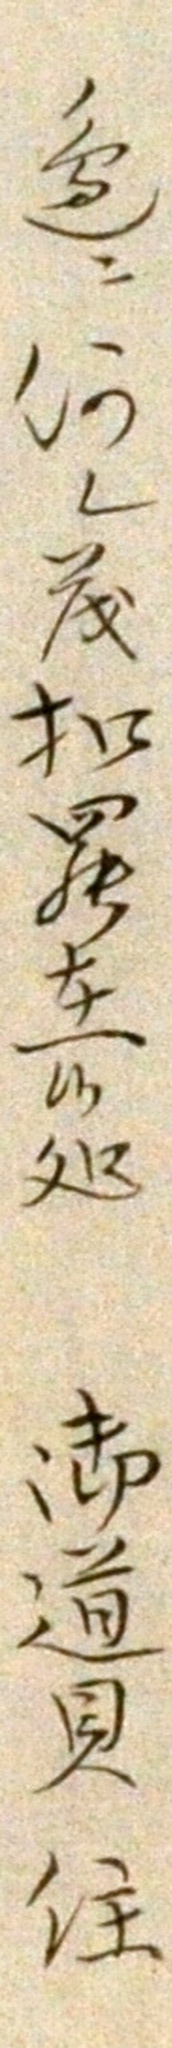辺ニ何レも扣罷在候処御道具注
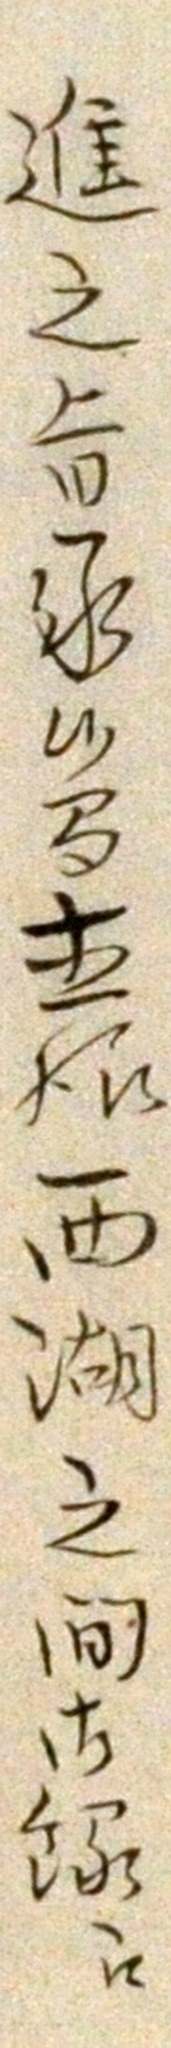進之旨承候間直様西湖之間御縁え
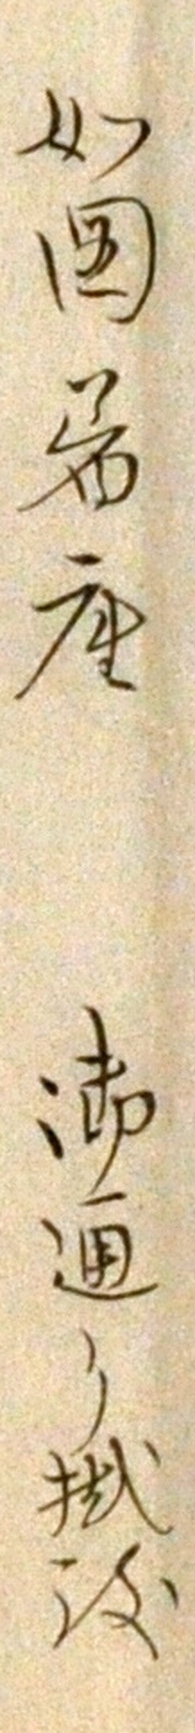如図着座御通り掛致
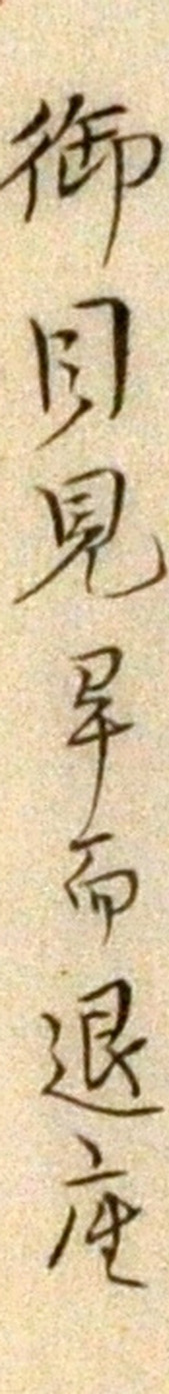御目見畢而退座
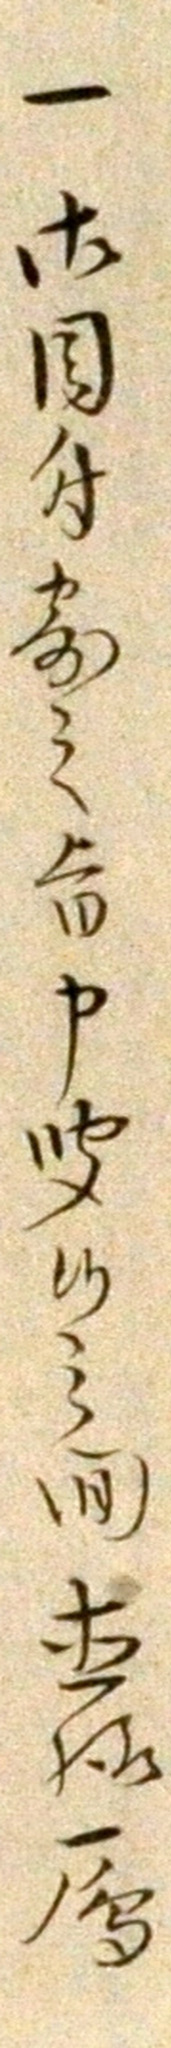一御目付寄之旨申聞候之間直様雁
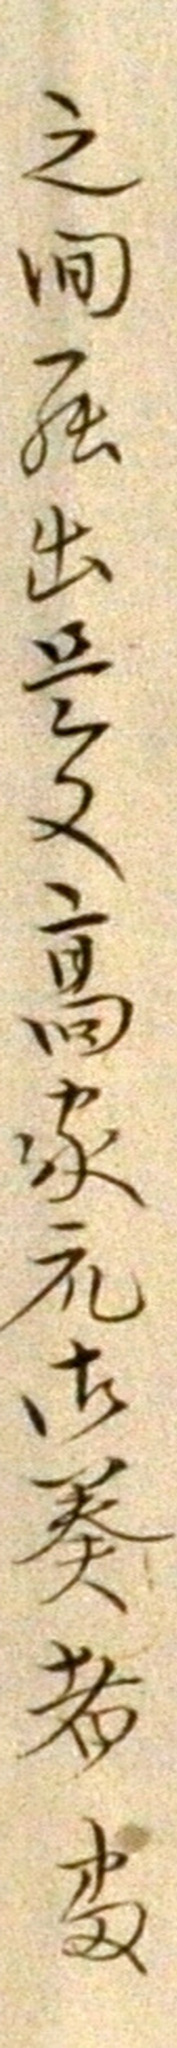之間罷出是又高家衆御奏者番
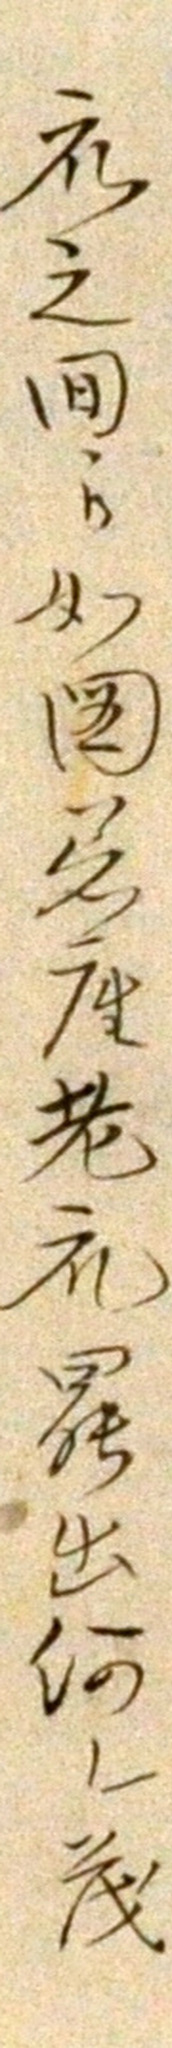衆之間え如図着座老衆罷出何レも
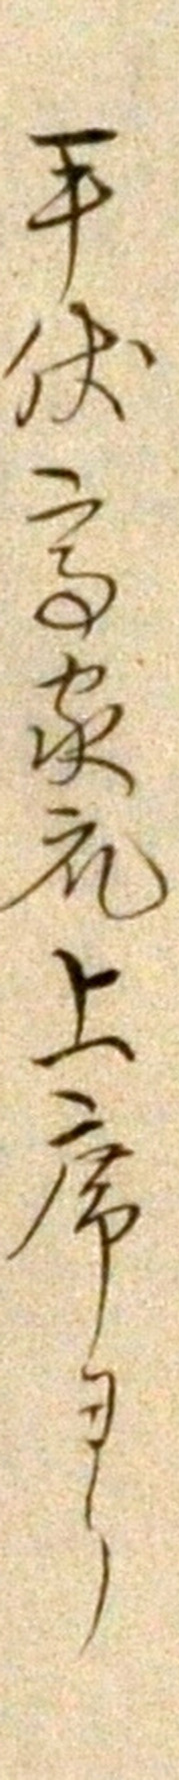平伏高家衆上座ヨリ
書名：御移徒相済御祝儀御能ノ節ノ留外
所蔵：伊那市立高遠町図書館・合同会社AMANE
